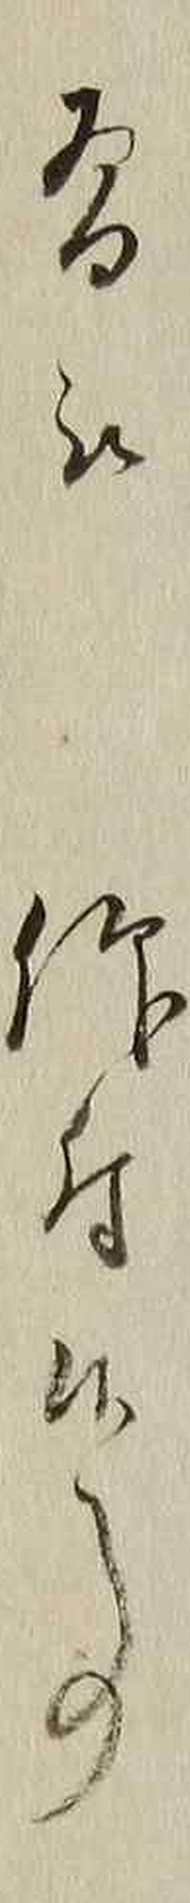習被仰付候事
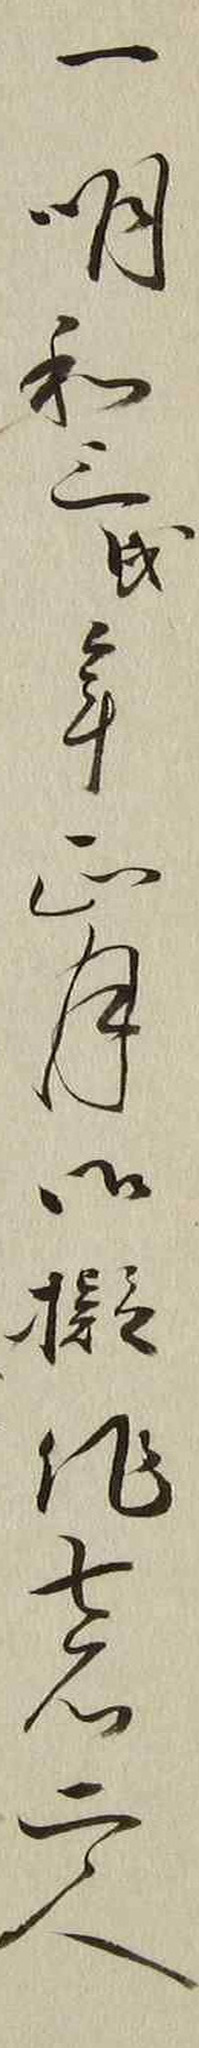一明和三戌年正月御擬作七石二人
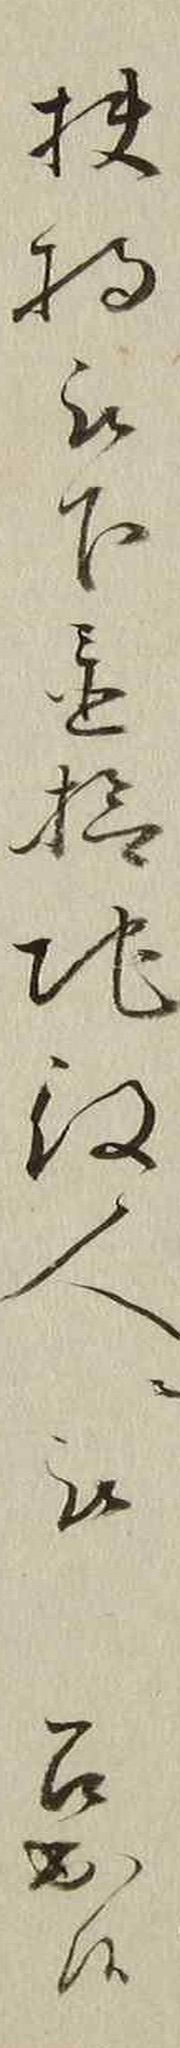扶持被下置検地役人ニ被召出候
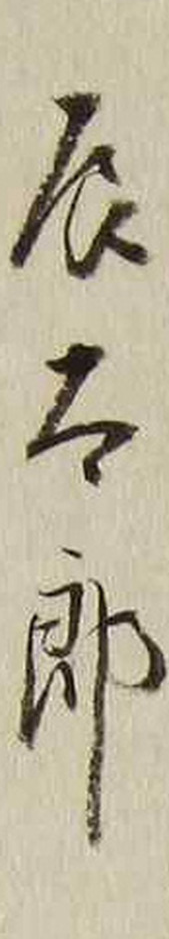辰太郎
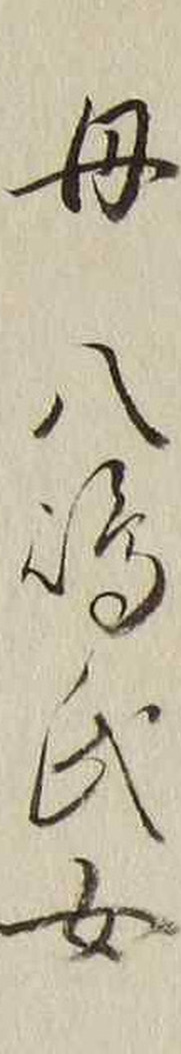母八嶋氏女

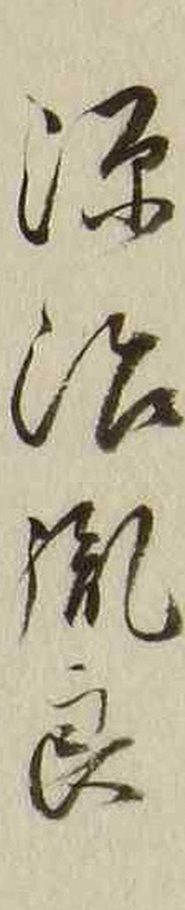源治胤良
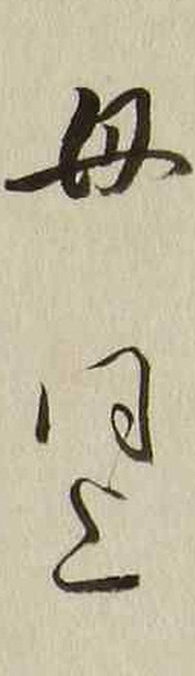母同上
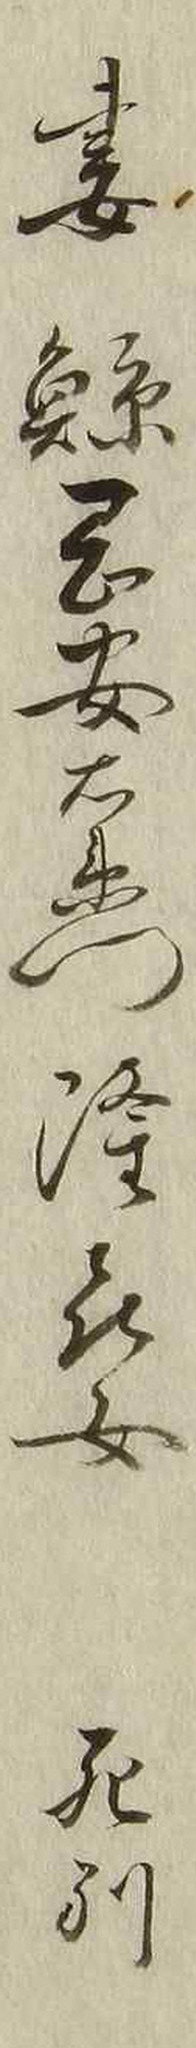妻鯨岡安右衛門隆喜女死別
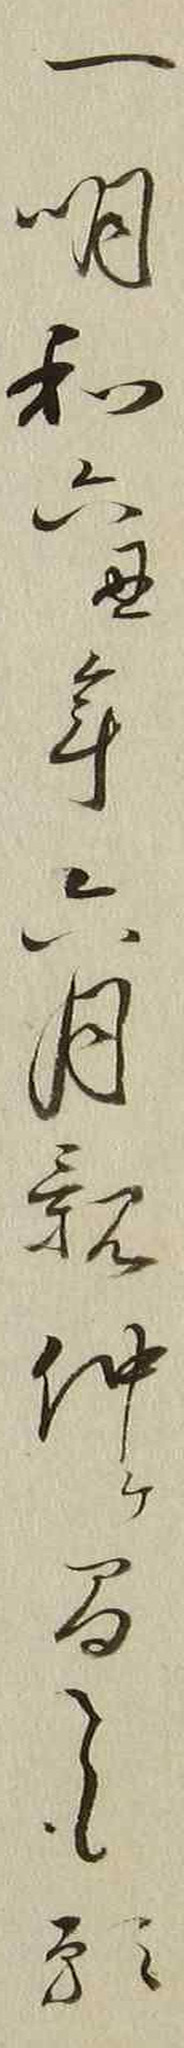一明和六丑年六月親仲ヶ間とも願
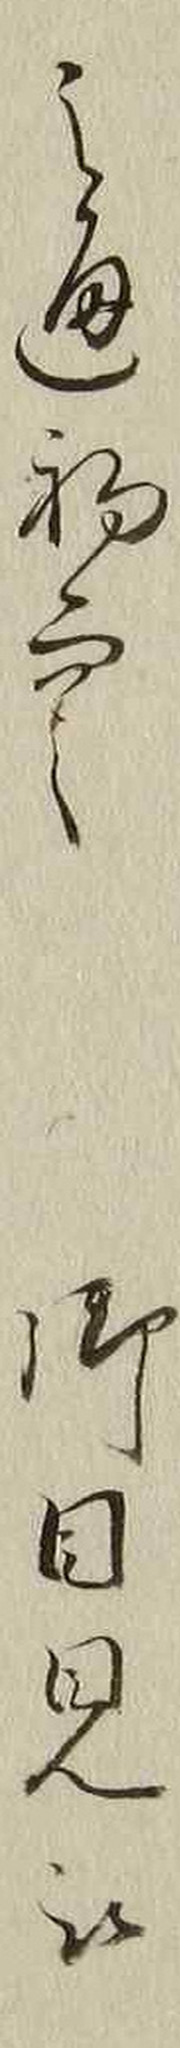之通初而之御目見被
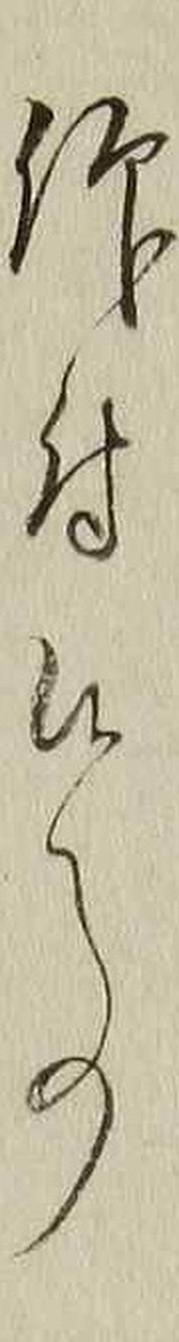仰付候事
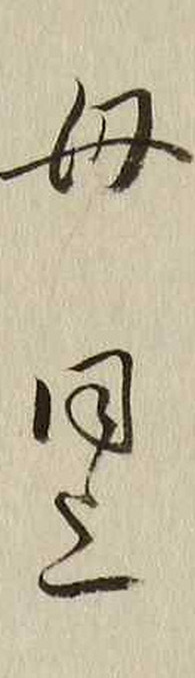母同上
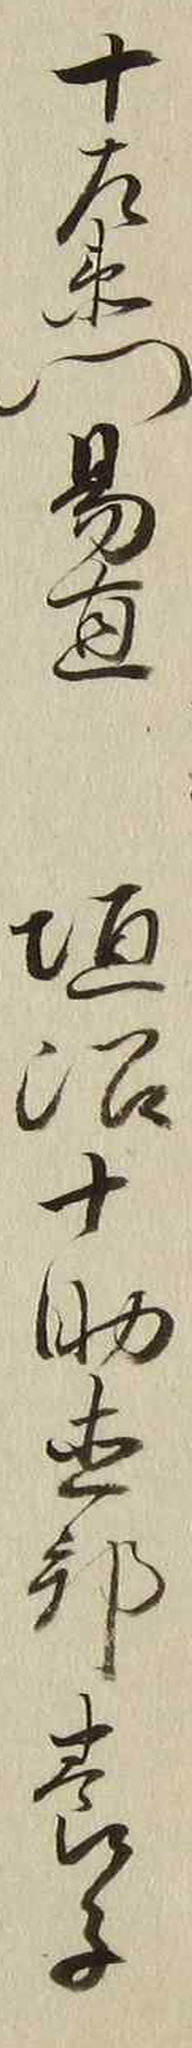十左衛門易直垣沼十助直邦養子
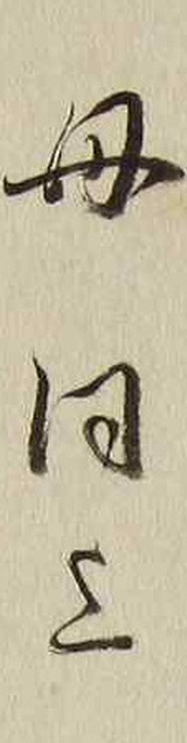母同上
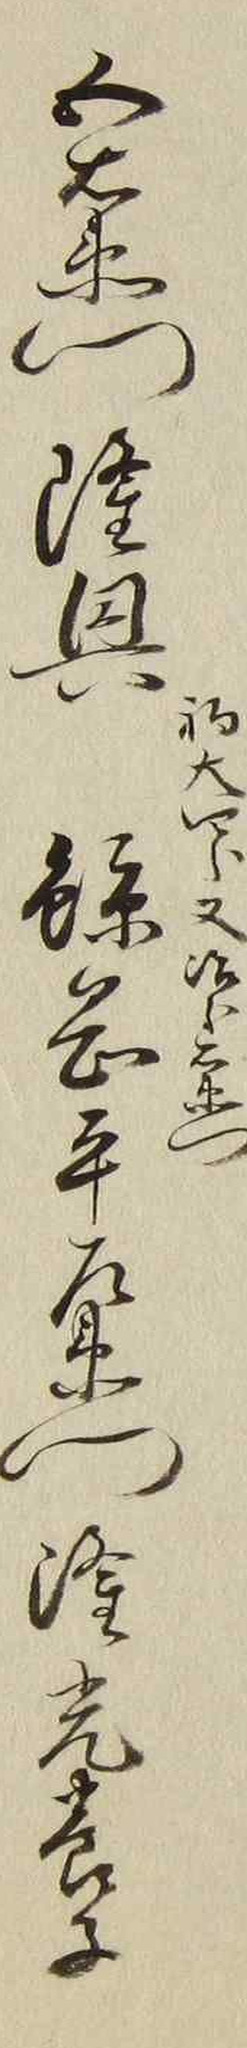五右衛門隆興鯨岡平左衛門隆光養子

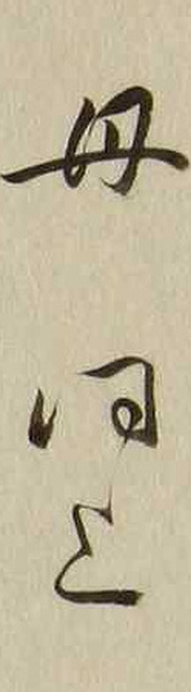母同上
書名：諸士系譜　巻之52　に之部3
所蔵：会津若松市立会津図書館
